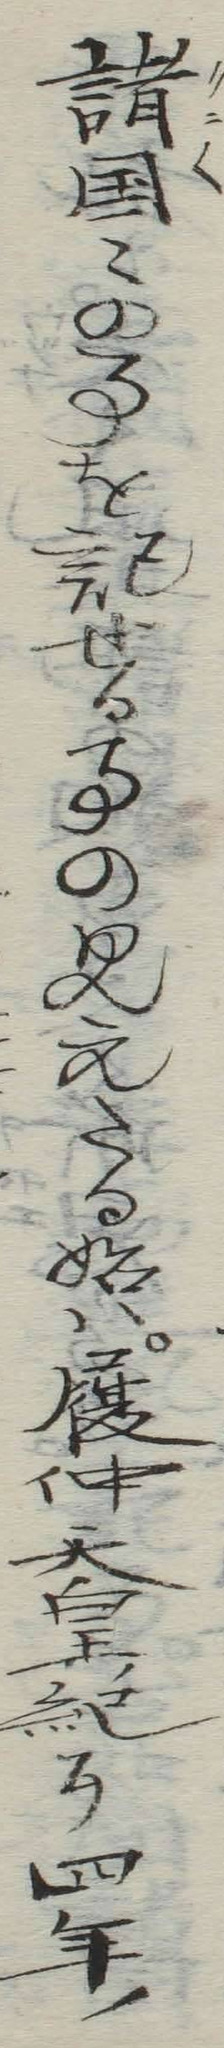諸国この事を記せる事の見えたる始は。履中天皇紀に四年

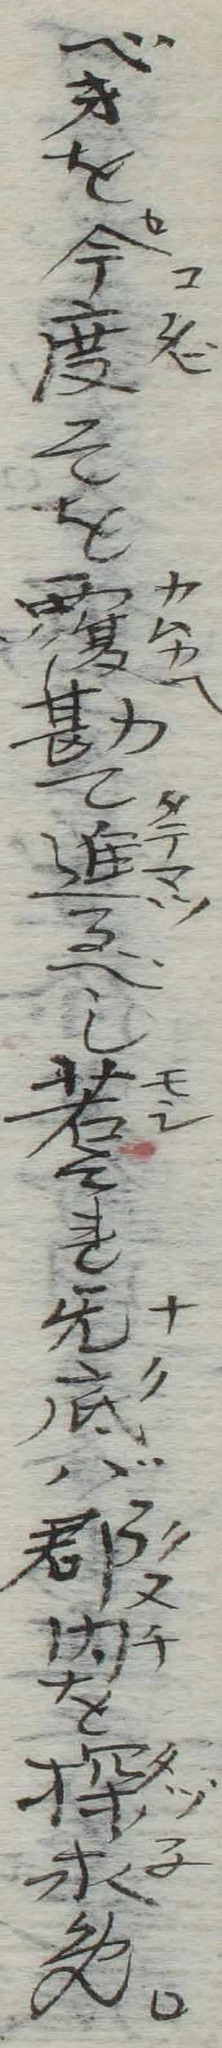べきを。今度そを覆勘て進るべし若それ無底ば郡内を探求め。
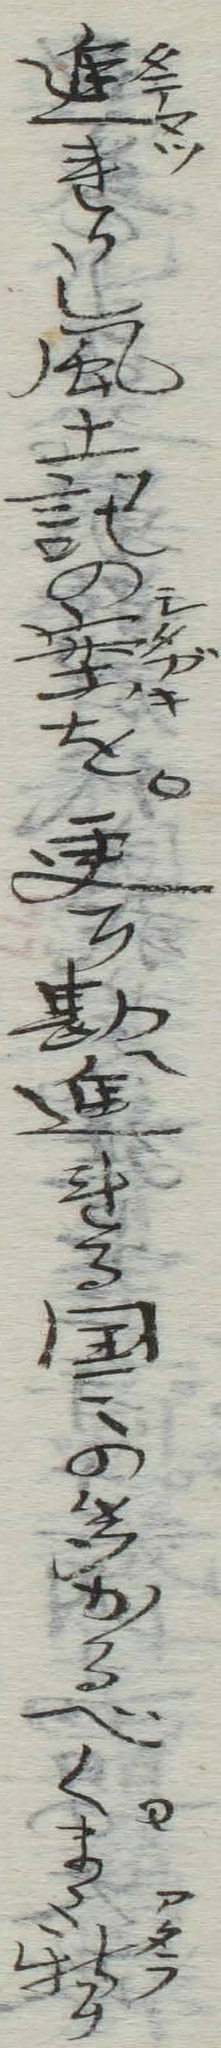進れりし風土記の案を。更に勘進れる国々の多かるべく。また新に
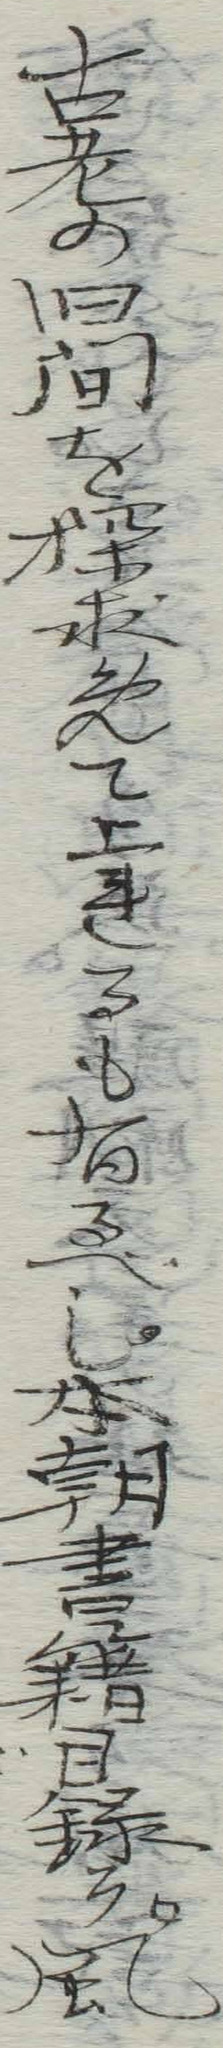古老の旧聞を探求めて上れるも有るべし。本朝書籍目録に。風
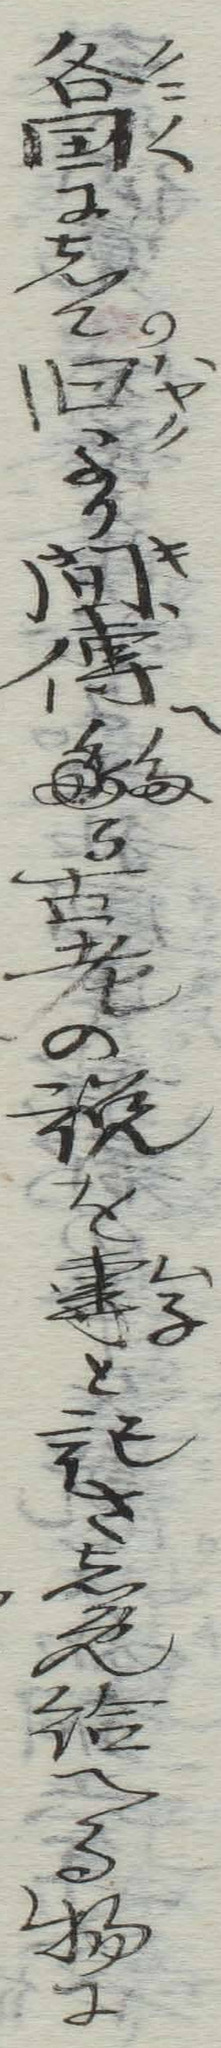各国にして。旧より聞伝古老の説を専と記さしめ給へる物に
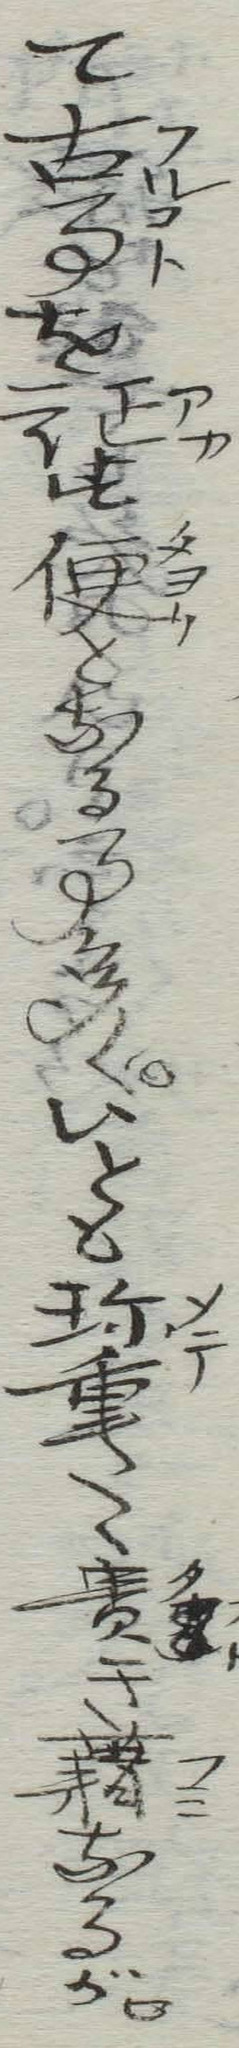て古事を証す便となる事多く。いとも珍重たく貴き籍なるが。
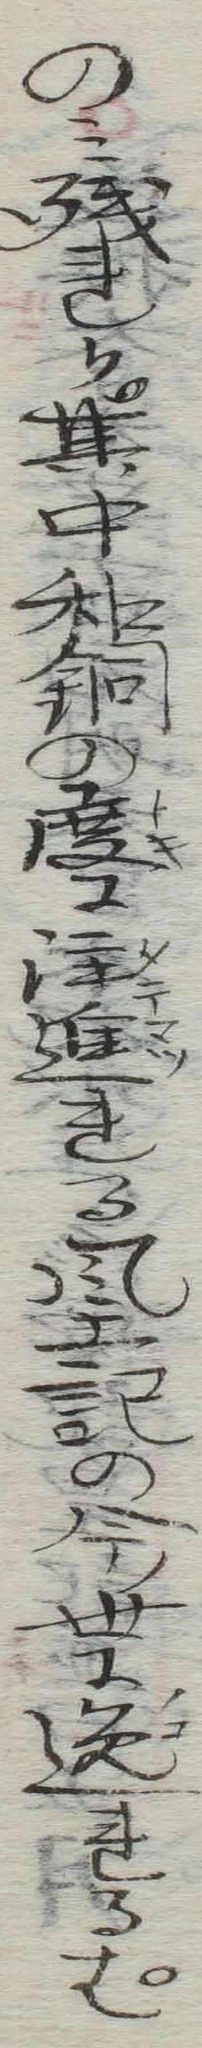のみ残れり。其中和銅の度に注進れる風土記の今世に逸れるは。
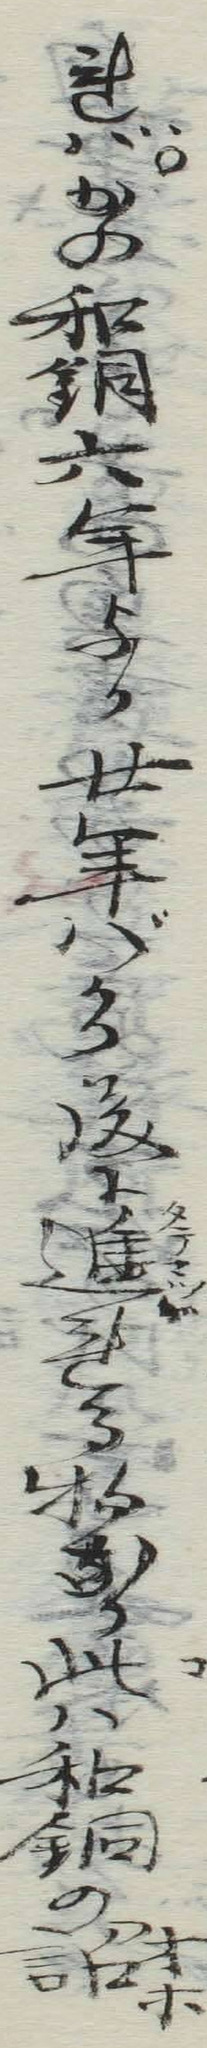れば。かの和銅六年より廿年ばかり後に進れる物なり此は和銅の詔
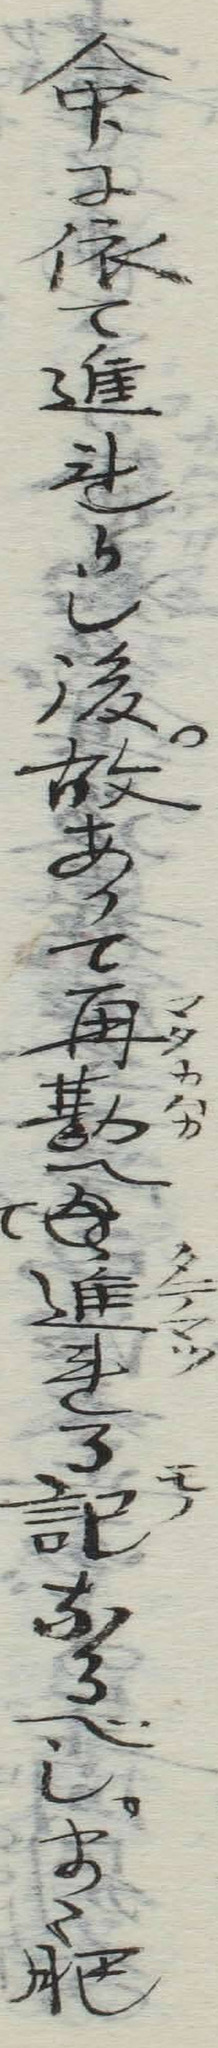命に依て進れりし後。故ありて再勘へて進れる記なるべし。また肥
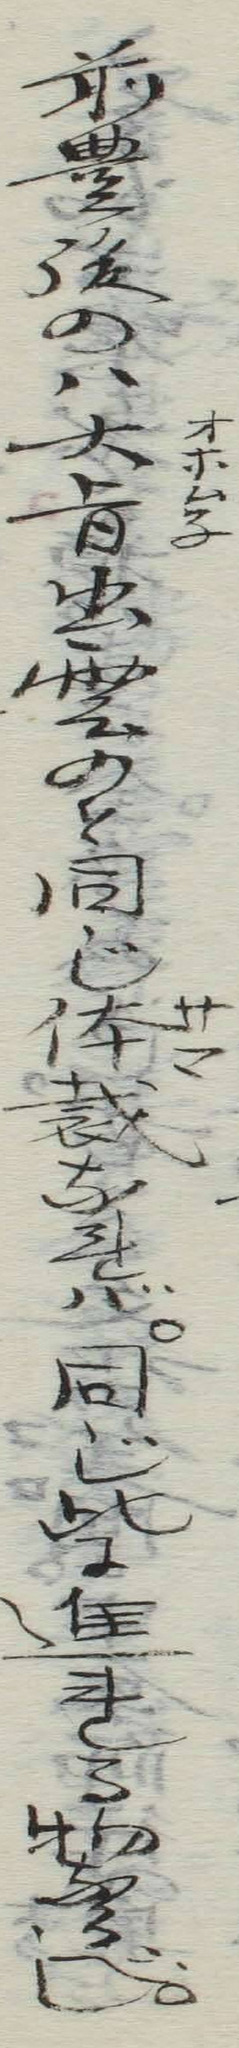前豊後のは大旨出雲のと同じ体裁なれば。同じ此に進れる物なるべし。
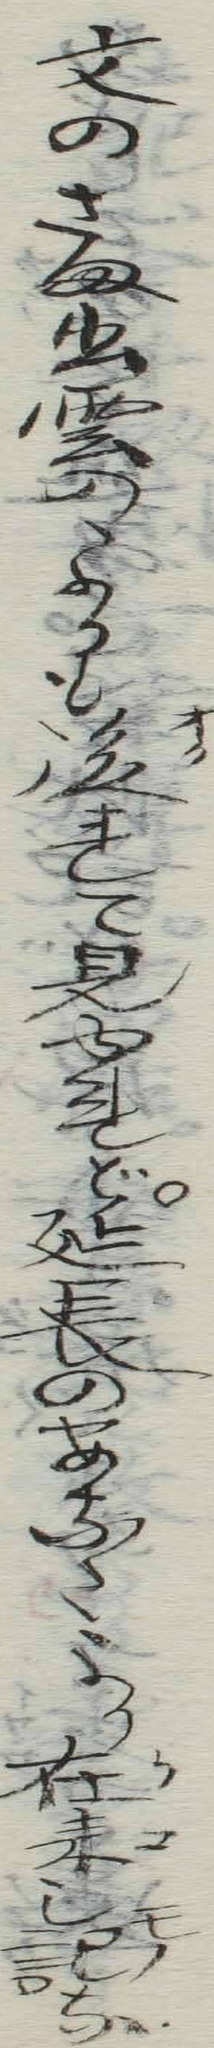文のさま出雲のよりも後れて見ゆれど。延長のあなたより在来し記な
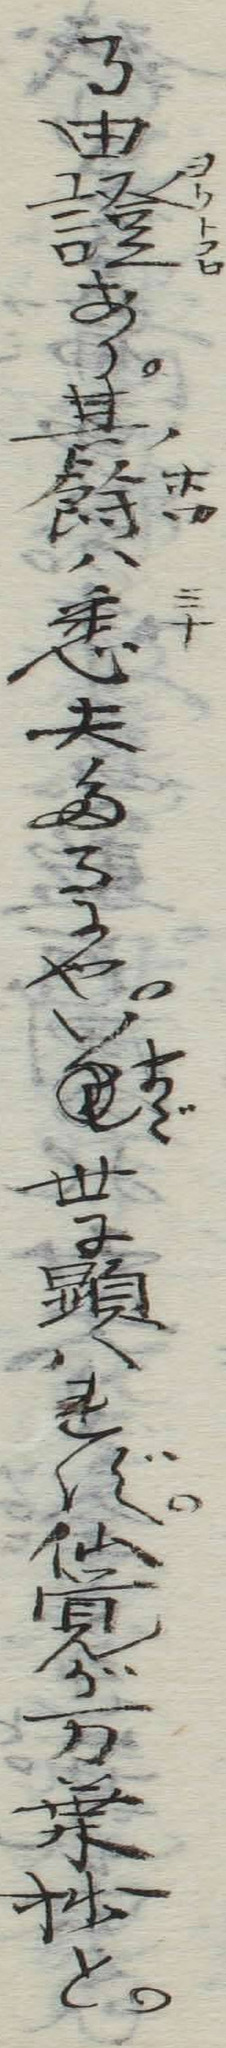る由證あり。其余は悉夫たるにや。いまだ世に顕はれず。仙覚が万葉抄と。
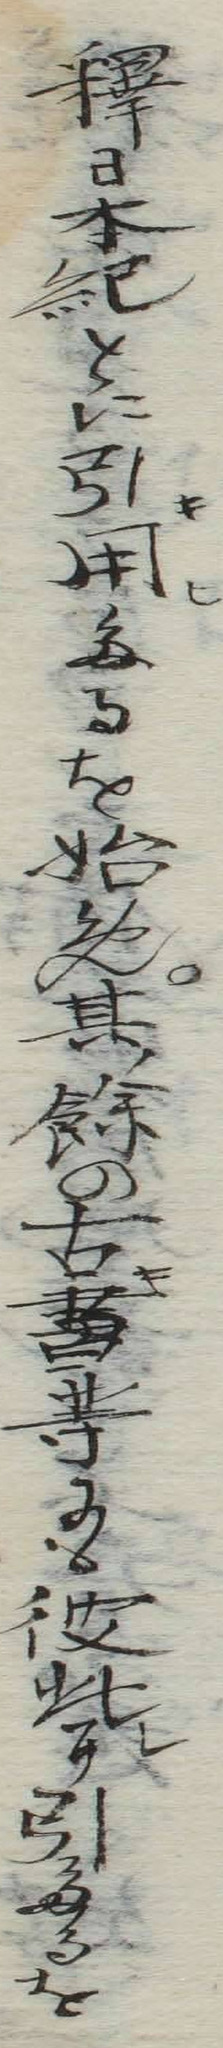釈日本紀とに引用たるを始め。其余の古書等にも彼此引たるを

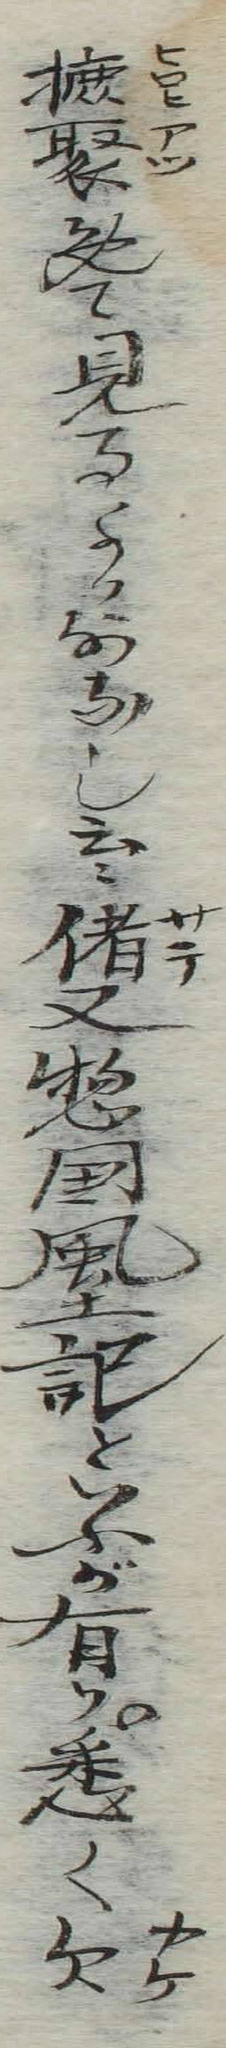摭聚めて見るより外なし云々偖又惣国風土記といふが有り。悉く欠
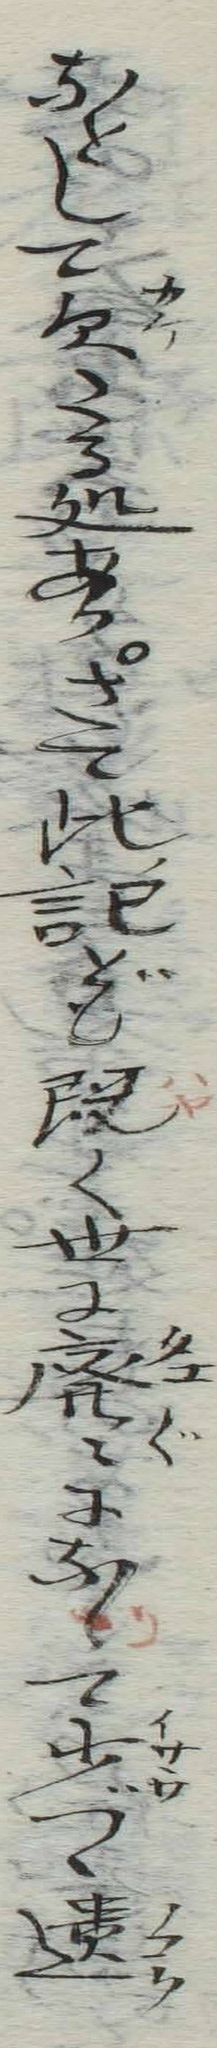なとして欠たる処あり。さて此記ども既くよ世に廃々になりて少づゝ遺
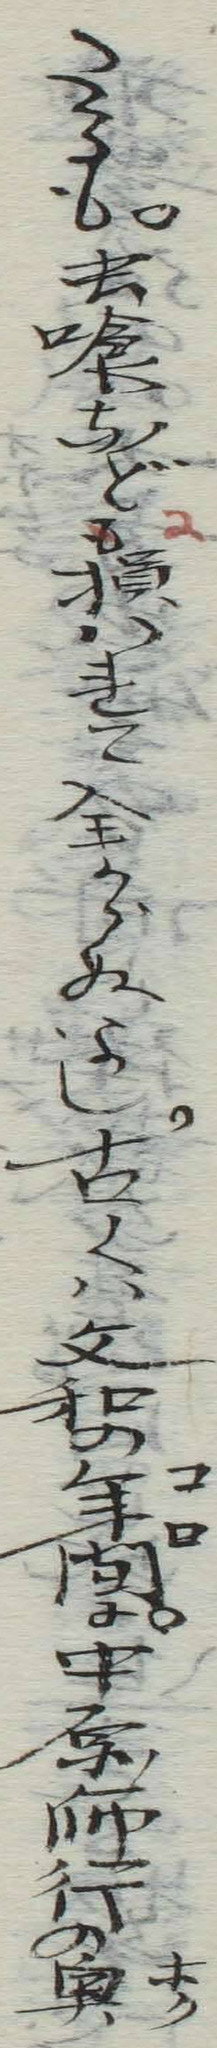たるも。虫喰などに損はれて全からぬよし。古くは文和の年間に。中原師行の奥
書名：三河国古跡考
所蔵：国文学研究資料館
